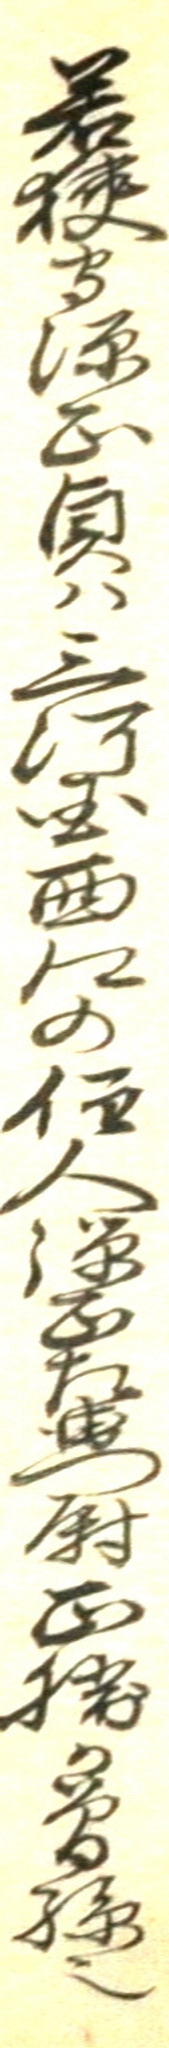若狭守源正貞は三河国西郷の住人源正左衛門尉正勝か曽孫也
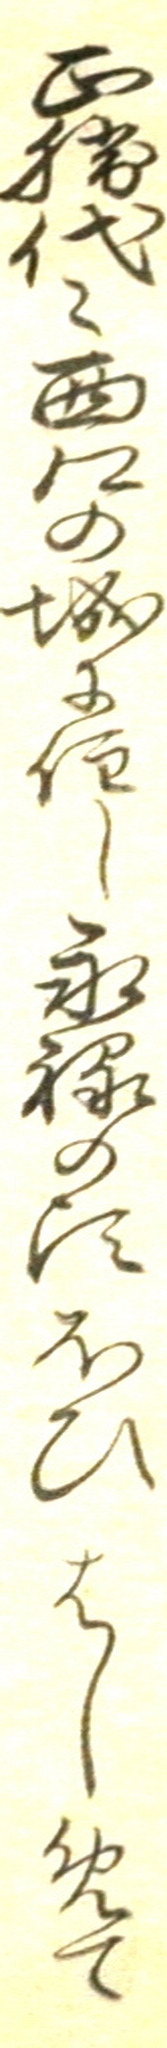正勝代々西郷の城に住し永禄の頃ほひはしめて
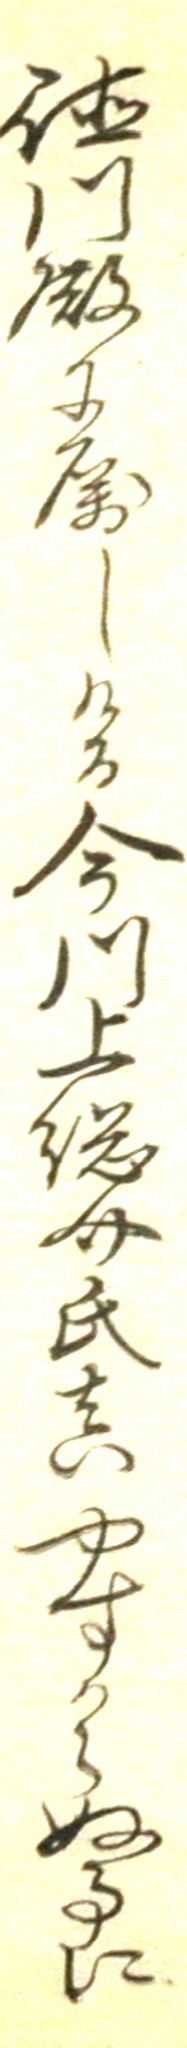徳川殿に属しける今川上総介氏真やすからぬ事に
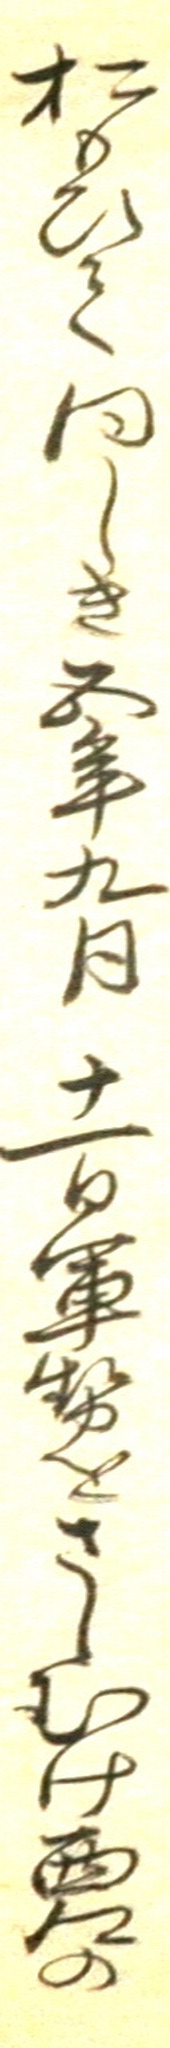おもひて同しき五年九月十一日軍勢をさしむけ西郷の
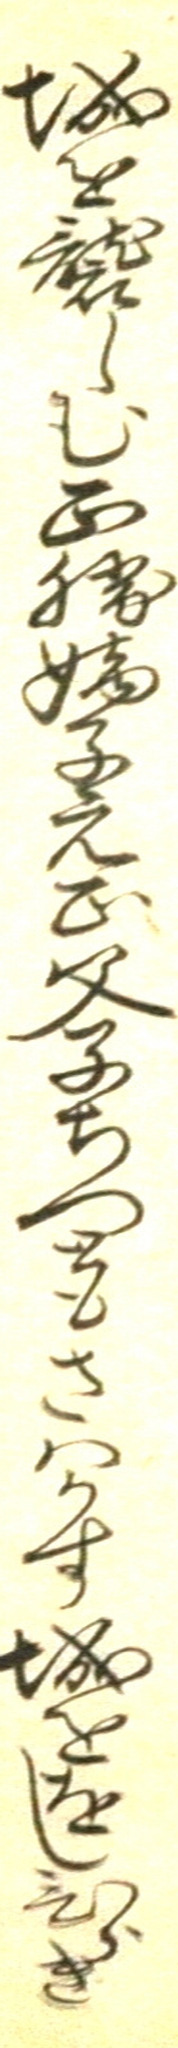城を襲しむ正勝嫡子元正父子ちつともさはかす城ををしひらき
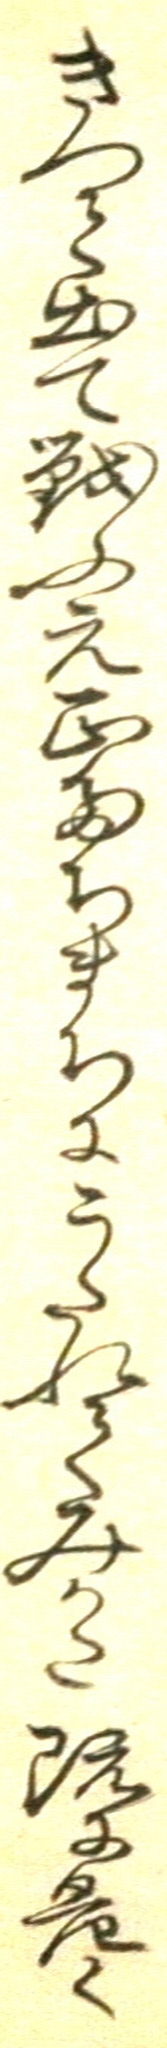きつて出て戦ふ元正たちまちにうたれてみかた既に危く
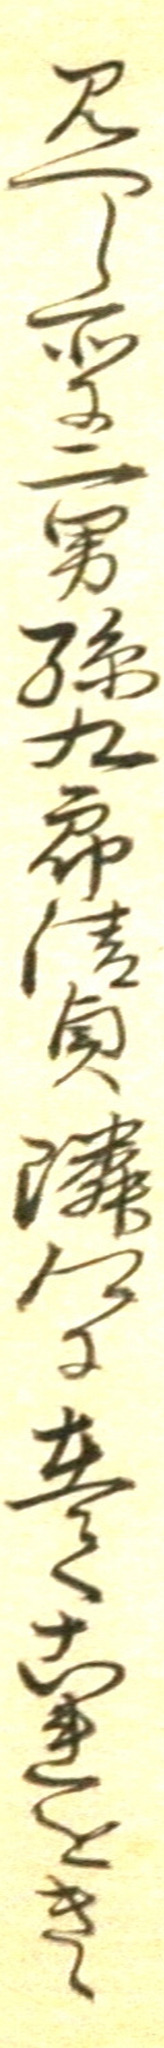見へし所に二男孫九郎清貞隣郷に在てこれをきゝ
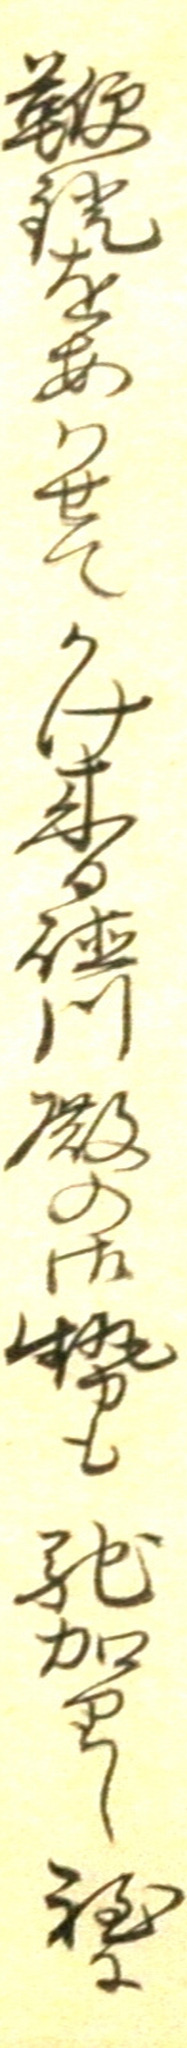鞭鐙をあはせてかけ来る徳川殿の御勢も馳加りし程に
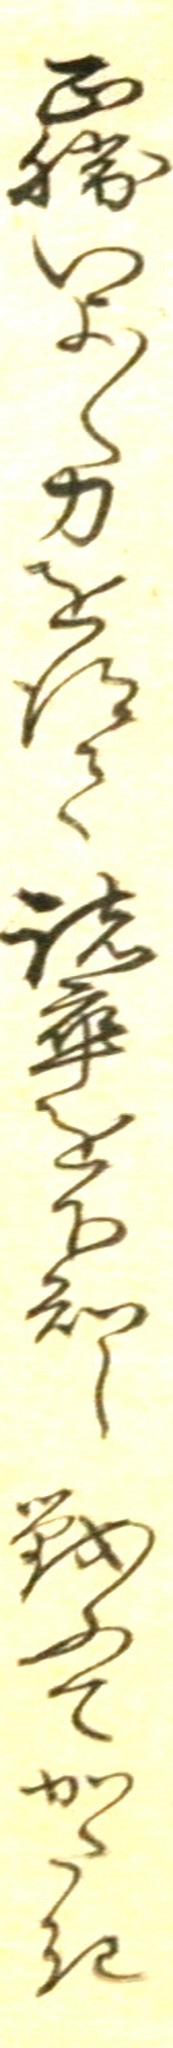正勝いよ〳〵力を得て諸卒を下知し戦ふてかたき

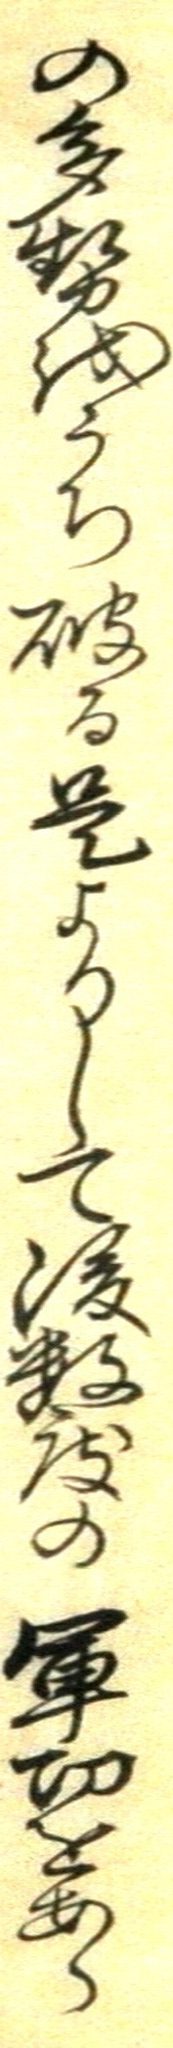の多勢をうち破る是よりして後数度の軍功をあら
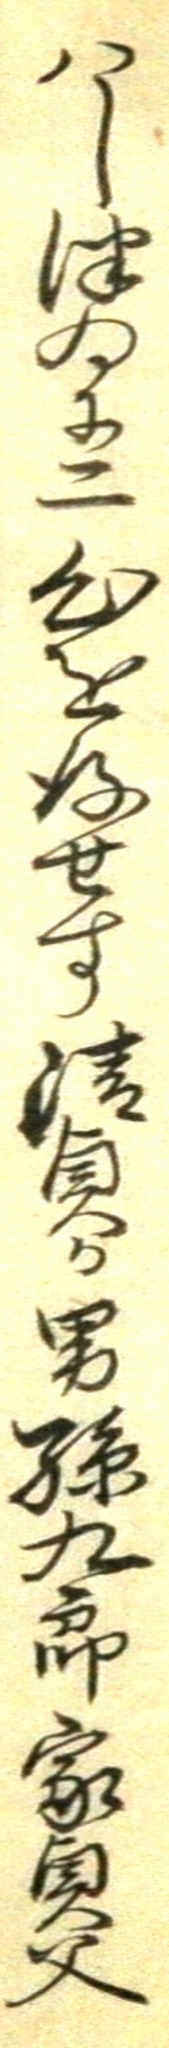はしつゐに二心を存せす清貞か男孫九郎家貞父
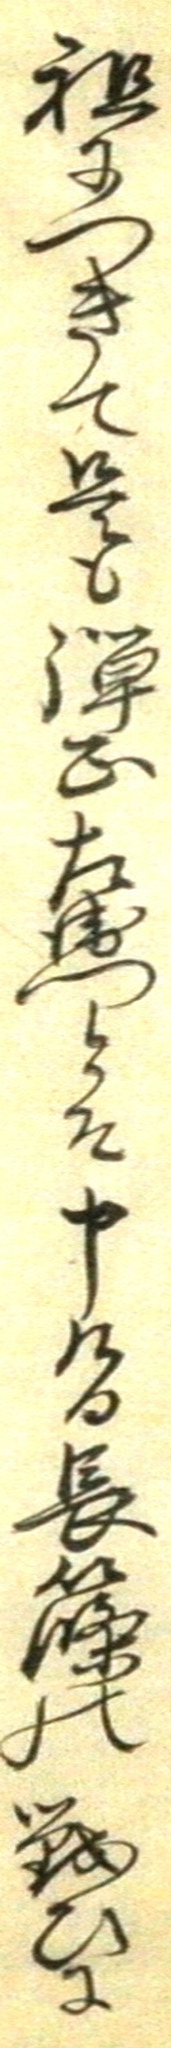祖につきて是も弾正左衛門とそ申ける長篠の戦ひに
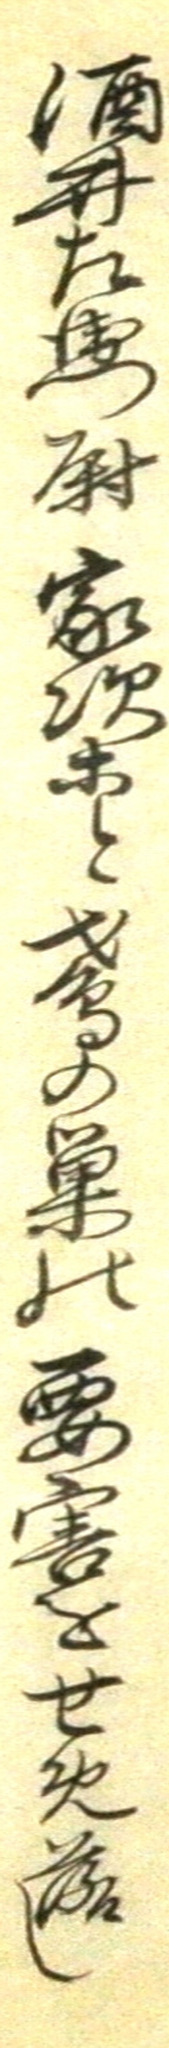酒井左衛門尉家次等と鳶の巣の要害をせめ落し
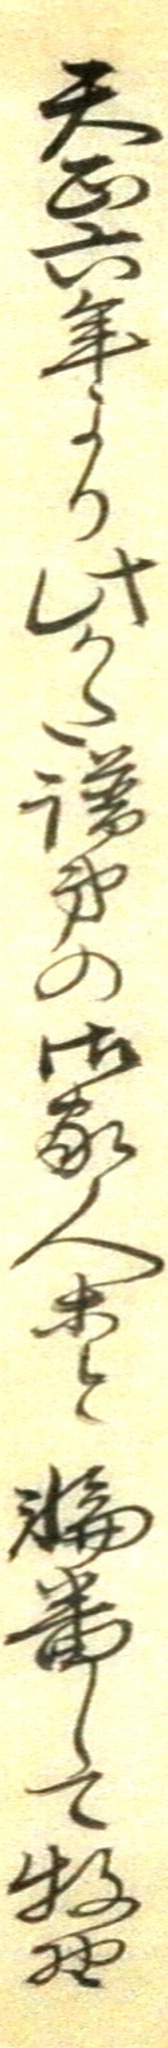天正六年より此かた譜第の御家人等と輪番して牧野
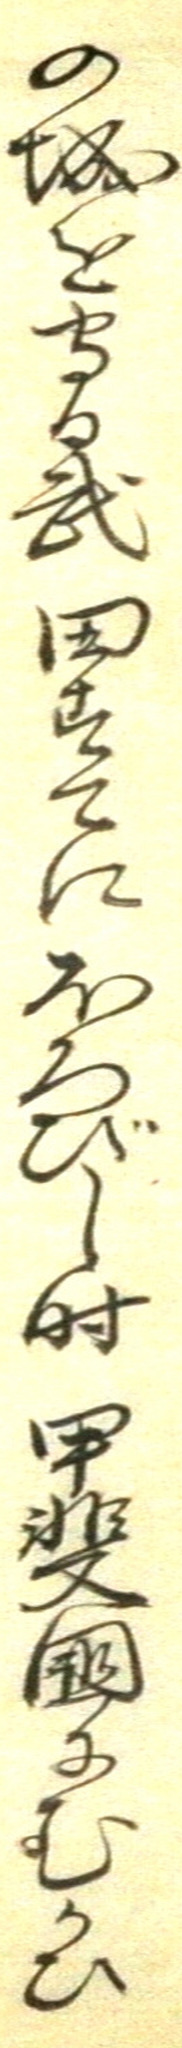の城を守る武田すてにほろびし時甲斐国にむかひ
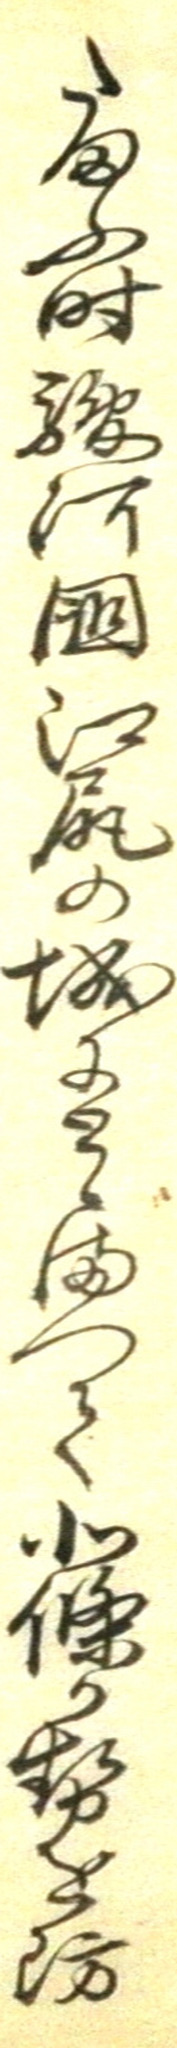たまふ時駿河国江尻の城にとゝまつて北条か勢を防
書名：藩翰譜（四・下）
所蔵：伊那市立高遠町図書館・合同会社AMANE
